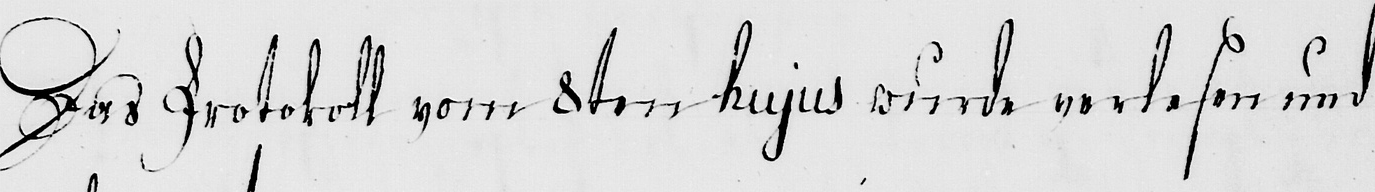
Das Protokoll vom 8ten hujus wurde verlesen und
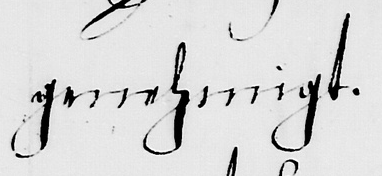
genehmigt.
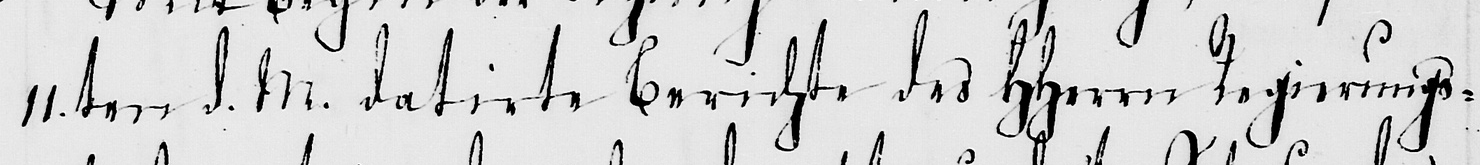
ten d. M. datirte Berichte des HHerrn Regierungs¬
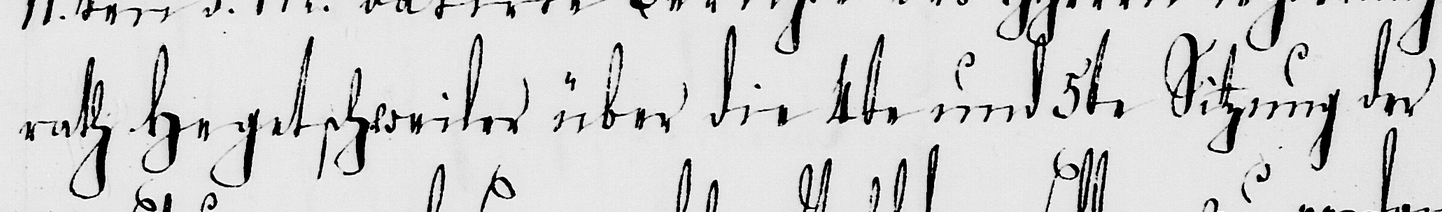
rath Hegetschweiler über die 4te und 5te Sitzung der
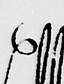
11.
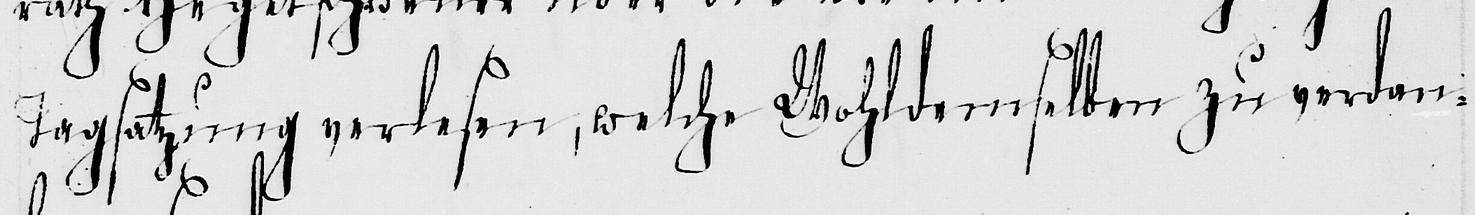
Tagsatzung verlesen, welche Wohldemselben zu verdan¬
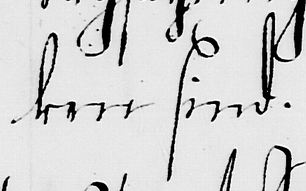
ken sind.
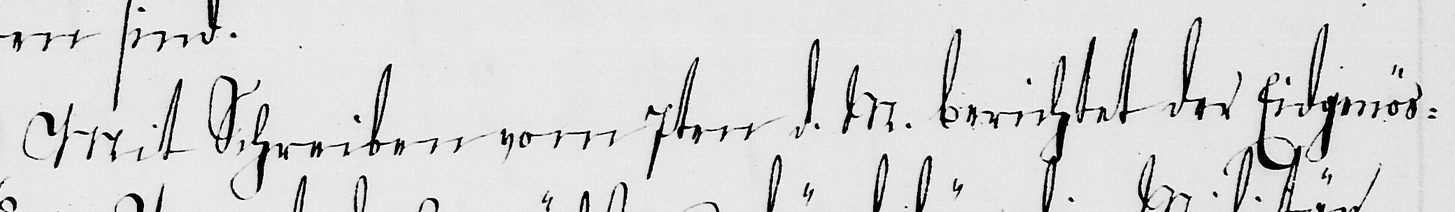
Mit Schreiben vom 7ten d. M. berichtet der Eidgenöß¬
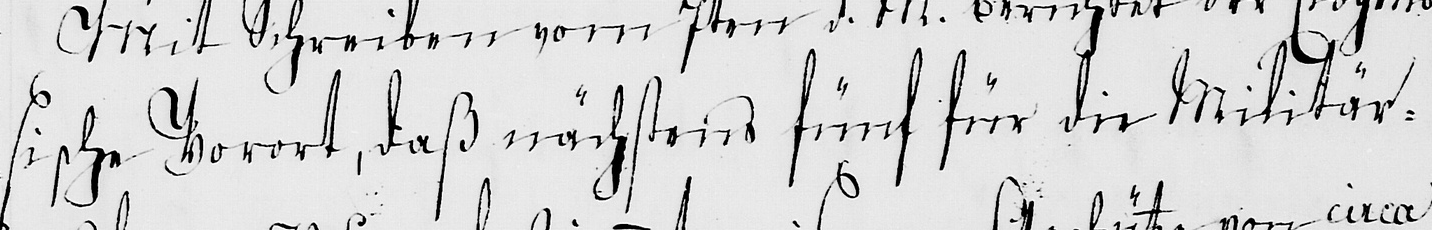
ische Vorort, daß nächstens fünf für die Militärs¬
